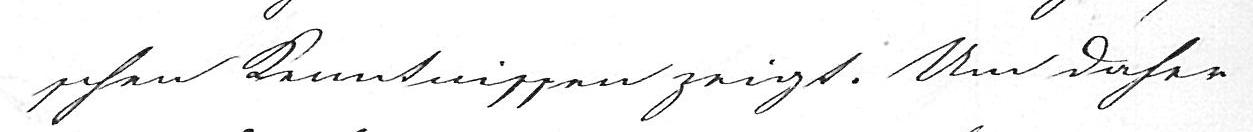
schen Kenntnissen zeigt. Um daher
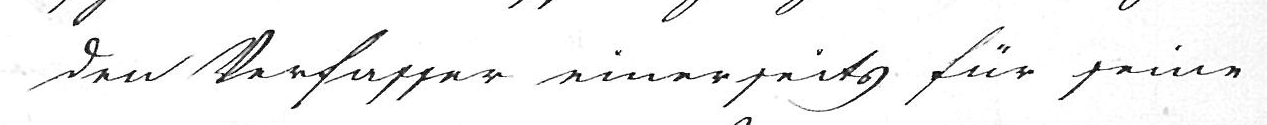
den Verfasser einerseits für seine
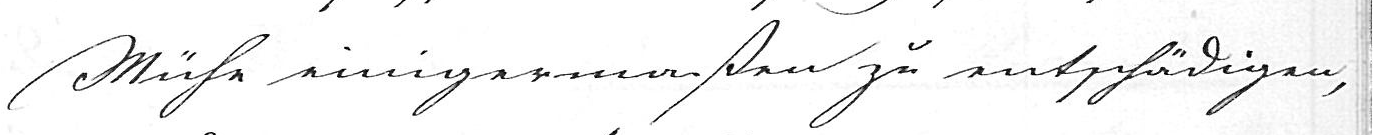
Mühe einigermaßen zu entschädigen,
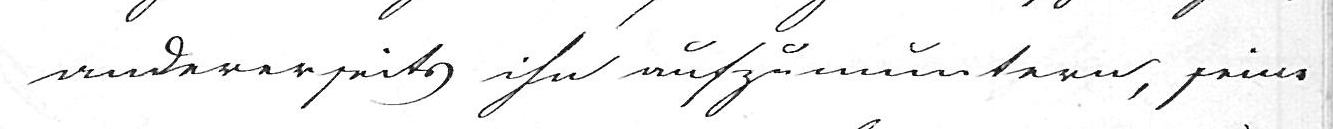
andererseits ihn aufzumuntern, seine
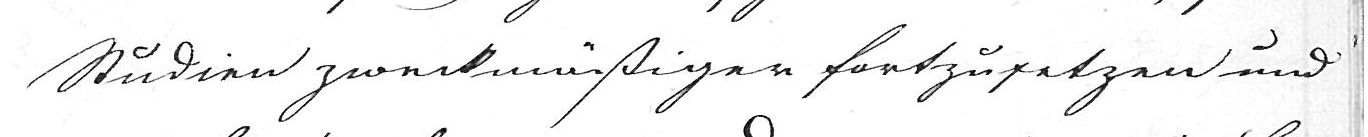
Studien zweckmäßiger fortzusetzen und
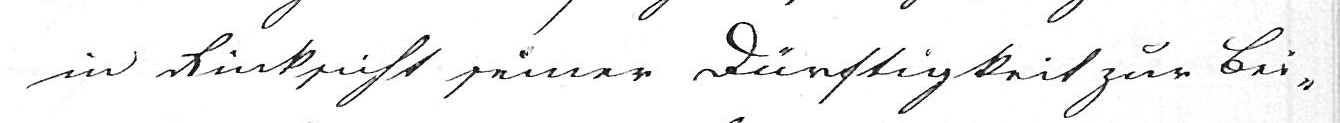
in Rücksicht seiner Dürftigkeit zur Bei-
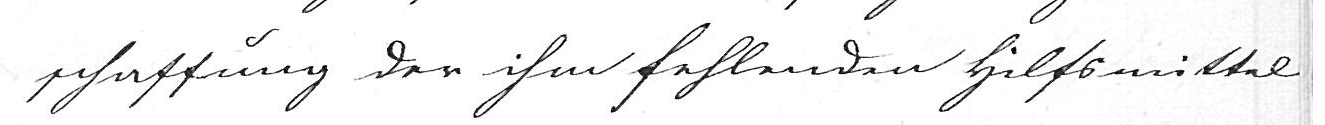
schaffung der ihm fehlenden Hilfsmittel
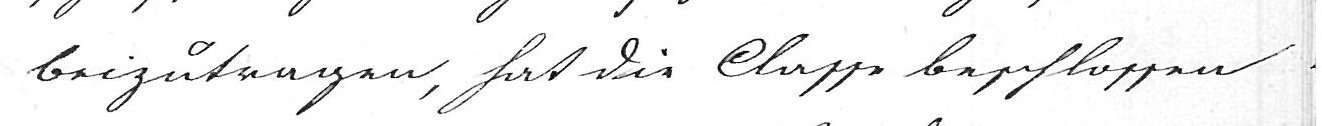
beizutragen, hat die Classe beschlossen
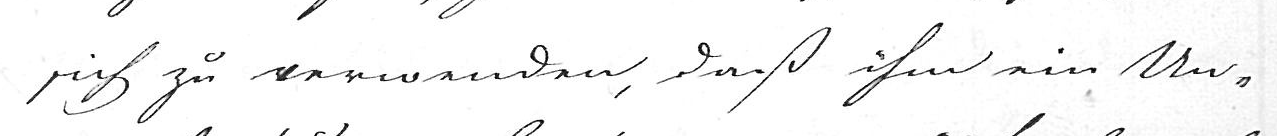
sich zu verwenden, daß ihm ein Un-
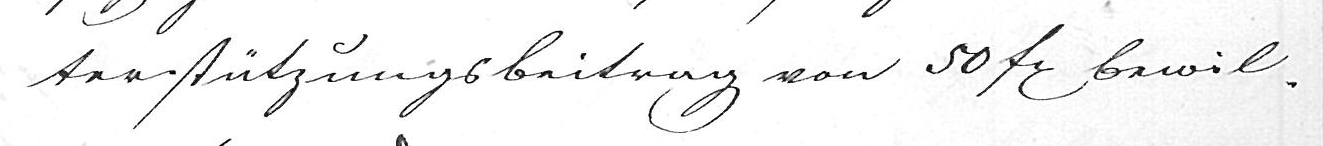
terstützungsbeitrag von 50 fr bewil-
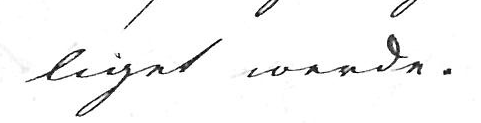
liget werde.
